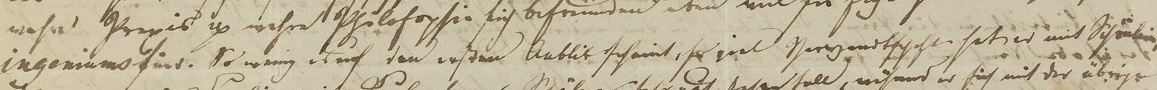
ingeniums sind. So wenig es auf den ersten Anblik scheint, so viel Verwandtschaft hat er mit Schönlein,
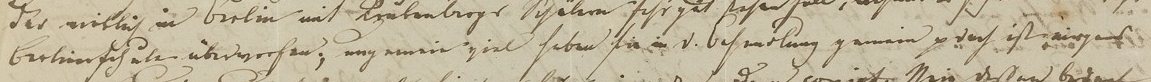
Berlinerschule überworfen; ungemein viel haben sie in d. Behandlung gemein & doch ist nirgends
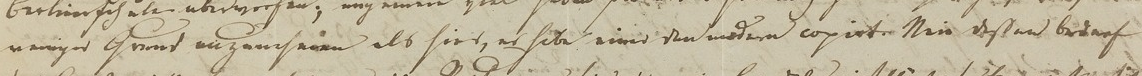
weniger Grund anzunehmen als hier, es habe einer den andern copirt. Nein dessen bedarf
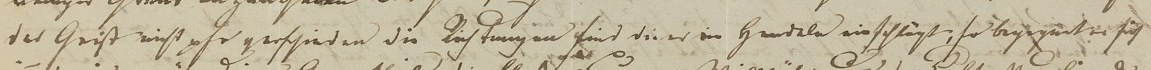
der Geist nicht & so verschieden die Richtungen sind die er im Handeln einschlägt, so begegnet er sich
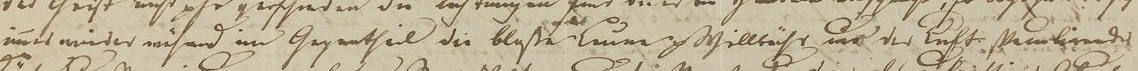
immer wieder während im Gegentheil die bloße Laune & Willkühr aus der Luft speculirender
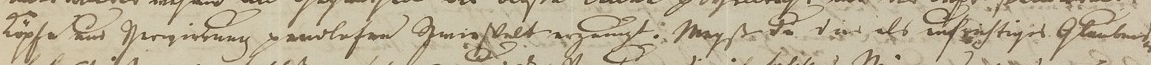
Köpfe nur Verwirrung & endlosen Zwiespalt erzeugt. Magst du das als aufrichtiges Glaubens-
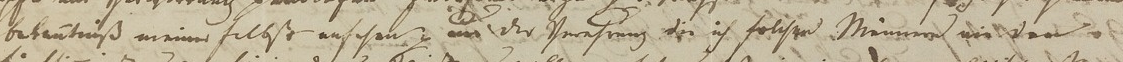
bekenntniß meiner selbst ansehen & um der Verehrung die ich solchen Männern wie den
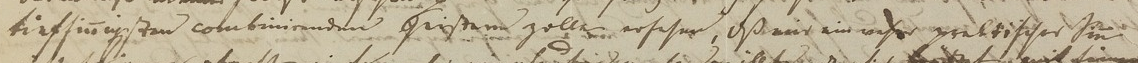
tiefsinnigsten combinirenden Geistern zolle ersehen, dß mir ein wahrer politischer Sinn
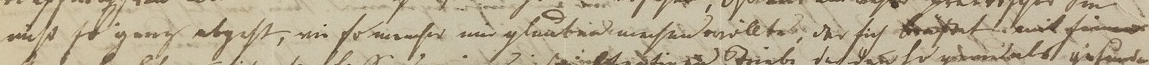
nicht so ganz abgeht, wie so mancher mir glauben machen wollte, der sich brüstet mit seinem
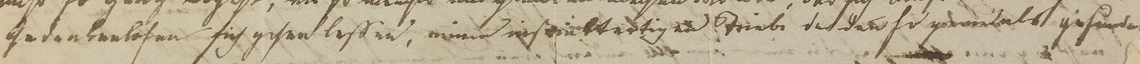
Gedankenlosen sich gehen lassen, einem instinktartigen Triebe der dann so gerne
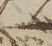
als
